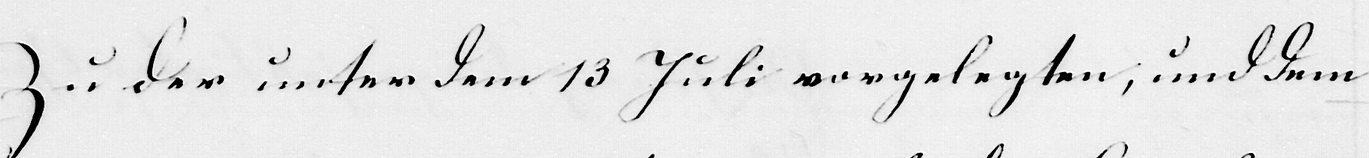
Zu der unter dem 13 Juli vorgelegten, und dem
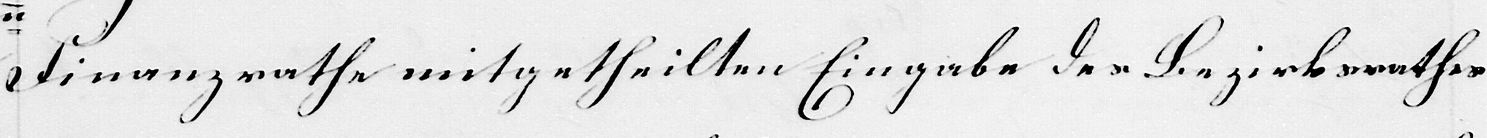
Finanzrathe mitgetheilten Eingabe des Bezirksrathes
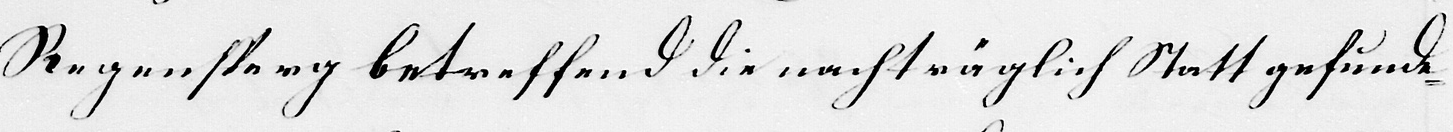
Regensperg betreffend die nachträglich Statt gefunde¬
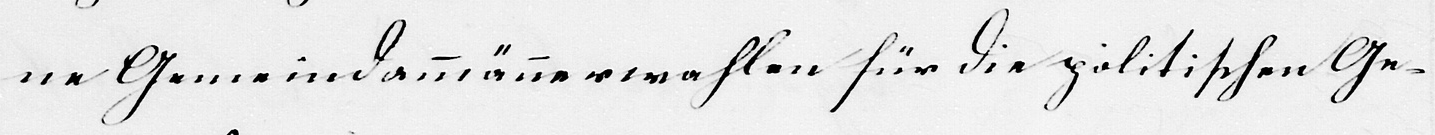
ne Gemeindammännerwahlen für die politischen Ge¬
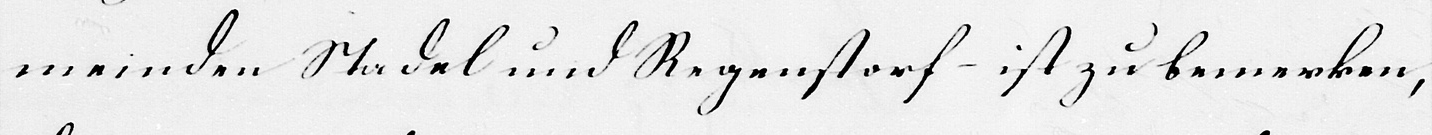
meinden Stadel und Regenstorf – ist zu bemerken,
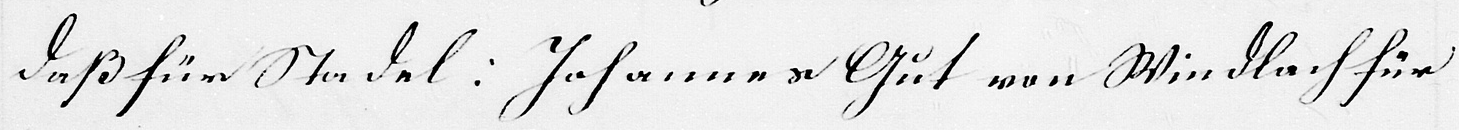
daß für Stadel: Johannes Gut von Windlach für
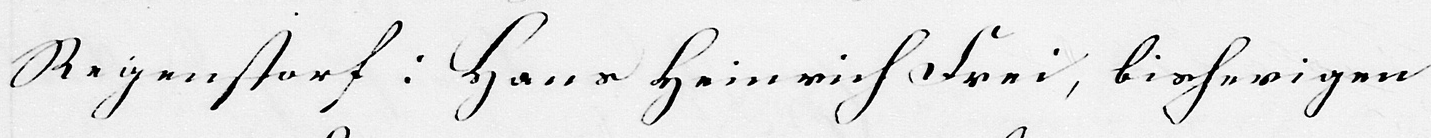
Regenstorf: Hans Heinrich Frei, bisherigen
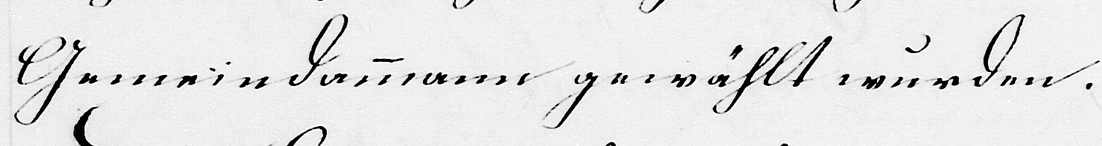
Gemeindammann gewählt wurden.
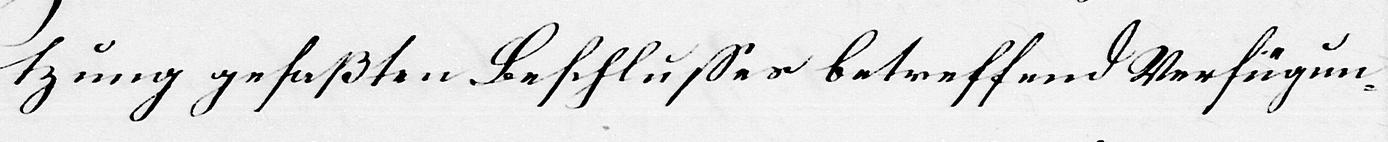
tzung gefaßten Beschlußes betreffend Verfügun¬
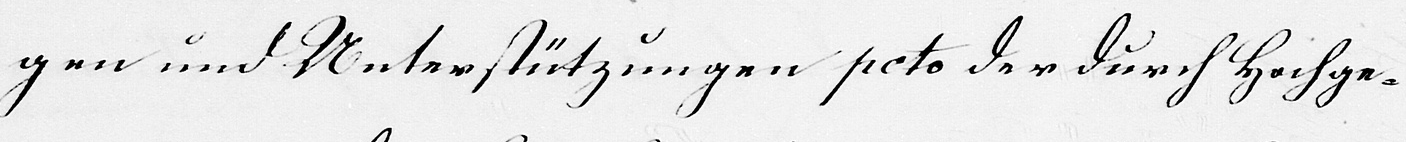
gen und Unterstützungen pcto der durch Hochge¬
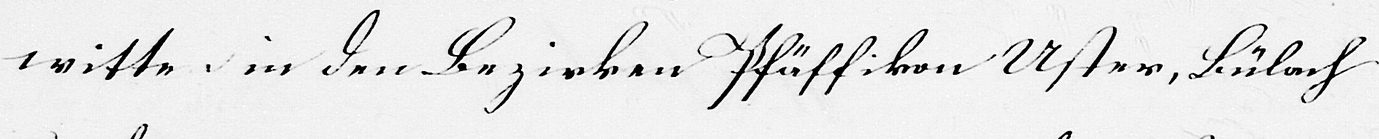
witter in den Bezirken Pfäffikon Uster, Bülach
